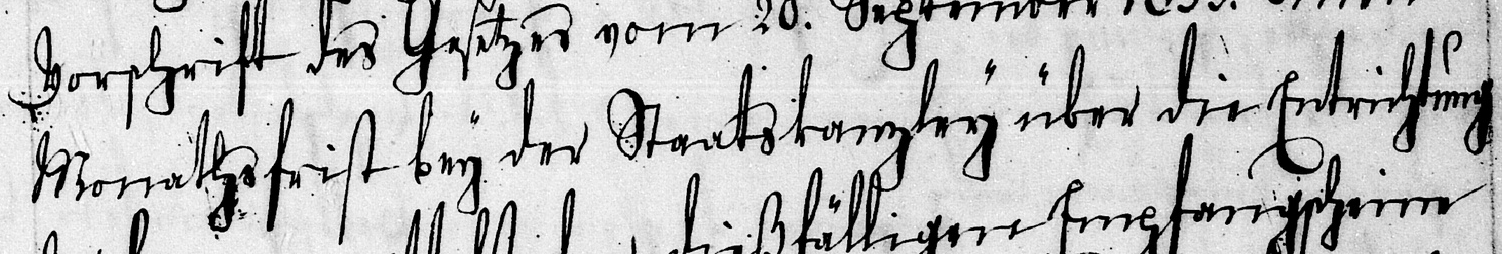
Monathsfrist bey der Staatskanzley über die Entrichtung
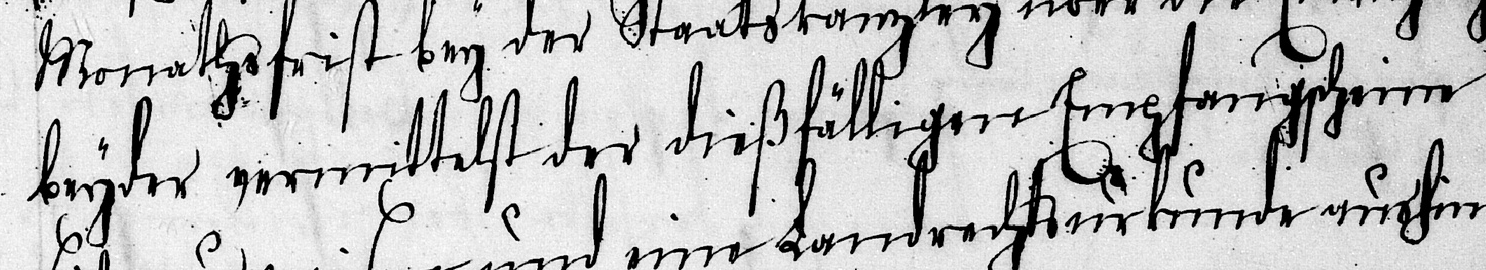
beyder vermittelst der dießfälligen Empfangscheine
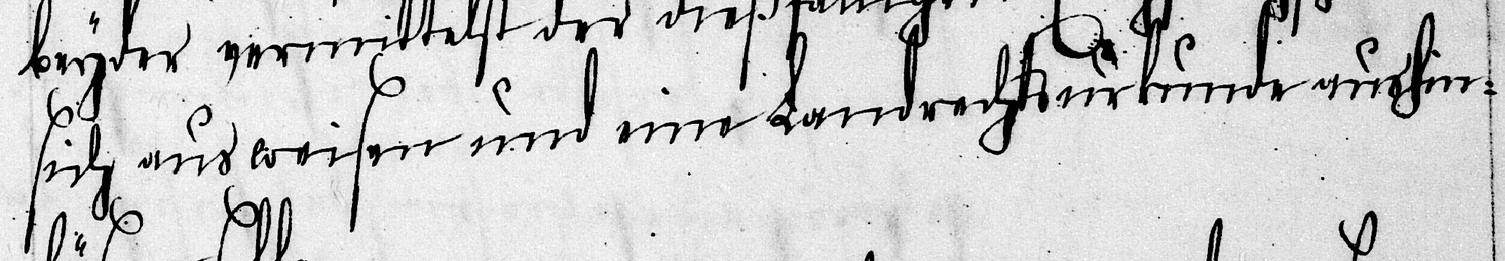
sich ausweisen und eine Landrechtsurkunde aushin¬
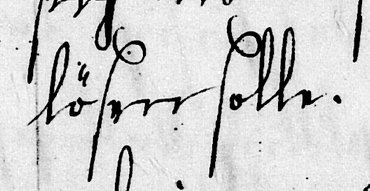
lösen solle.
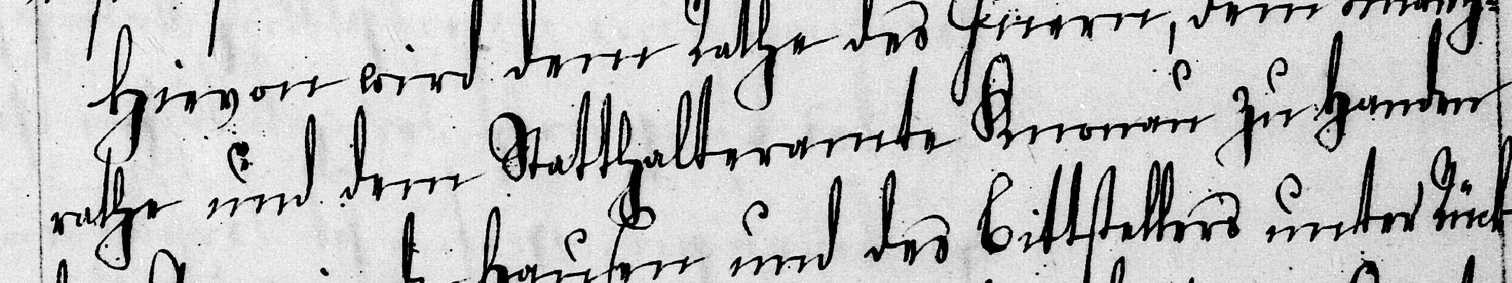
rathe und dem Statthalteramte Knonau zu Handen
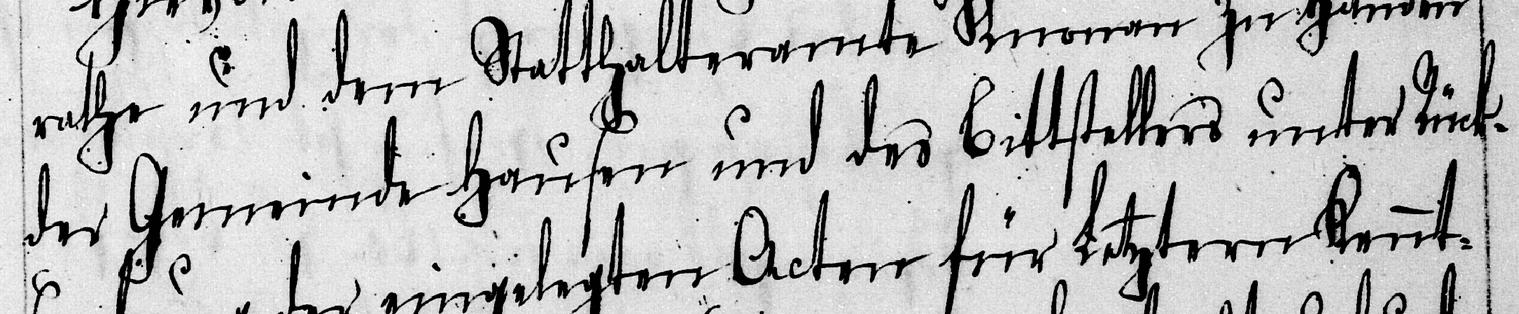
der Gemeinde Hausen und des Bittstellers unter Rüc¬
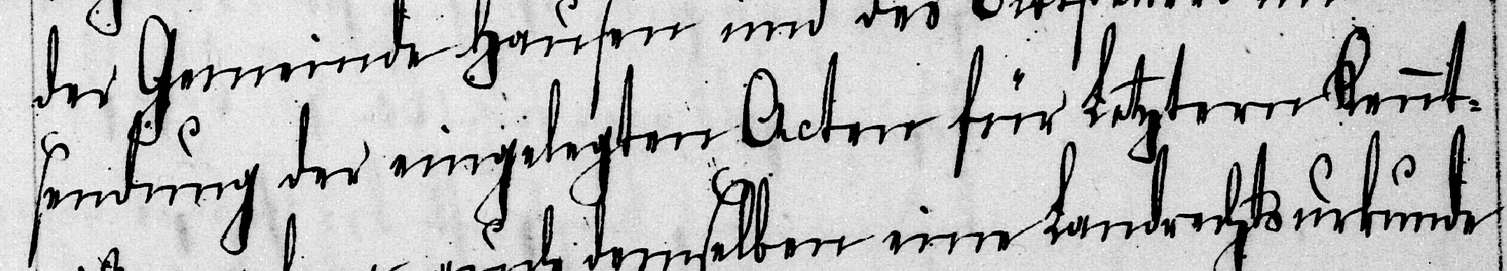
sendung der eingelegten Acten für Letztern Kennt¬
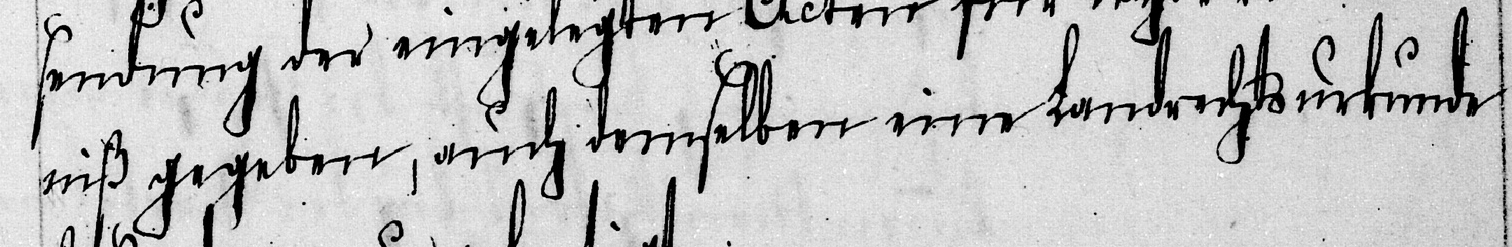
niß gegeben, auch demselben eine Landrechtsurkunde
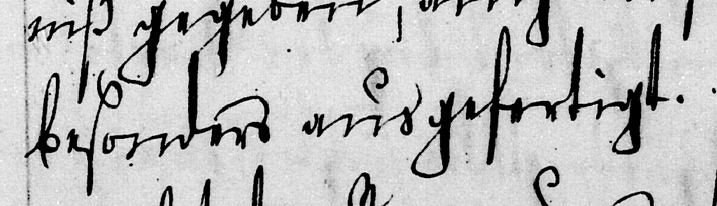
besonders ausgefertigt.
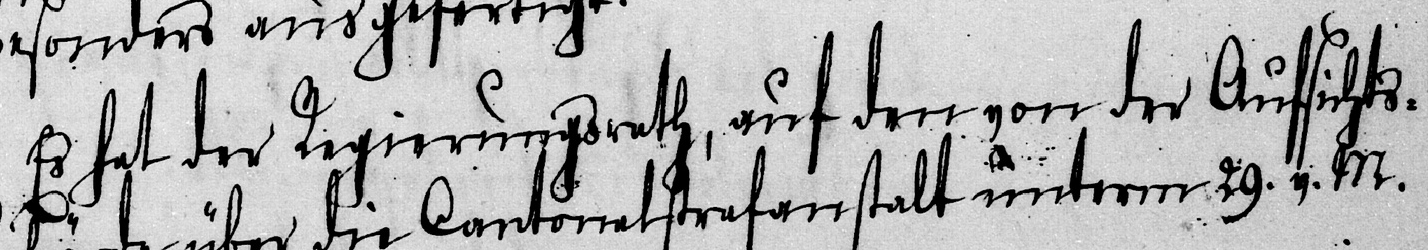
Es hat der Regierungsrath, auf den von der Aufsicht¬
